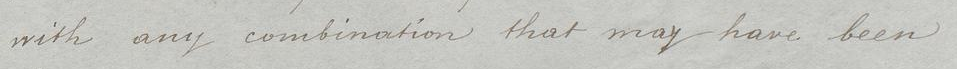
with any combination that may have been
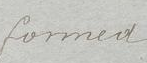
formed
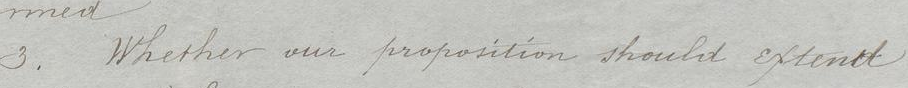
3. Whether our proposition should extend
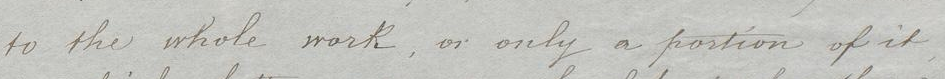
to the whole work, or only a portion of it
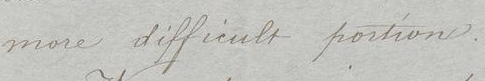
more difficult portion.
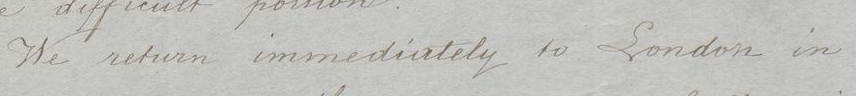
We return immediately to London in
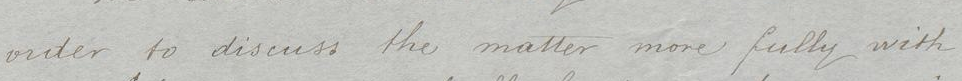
order to discuss the matter more fully with
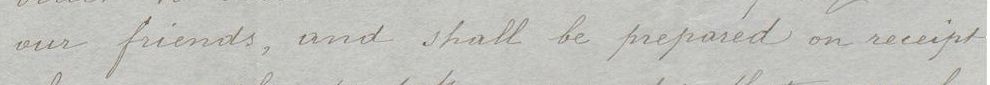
our friends, and shall be prepared on receipt
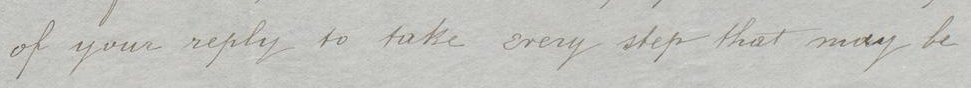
of your reply to take every step that may be
